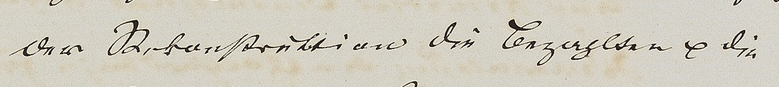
der Rekonstruktion die bezahlten & die
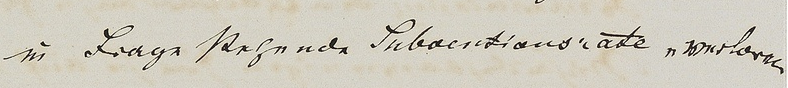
in Frage stehende Subventionsrate «verloren»
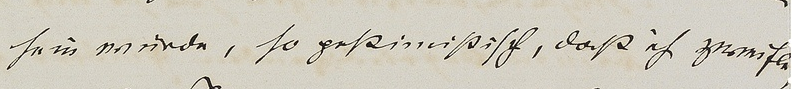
sein würde, so peßimistisch, daß ich zweifle,
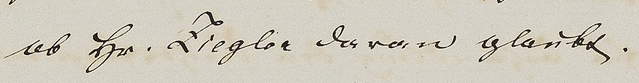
ob Hr. Ziegler daran glaubt. –
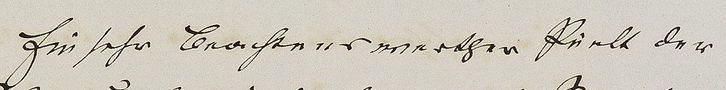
Ein sehr beachtenswerther Punkt der
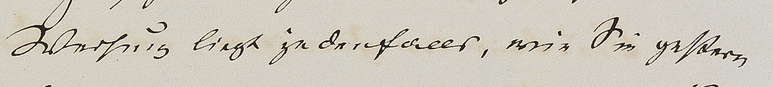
Weisung liegt jedenfalls, wie Sie gestern
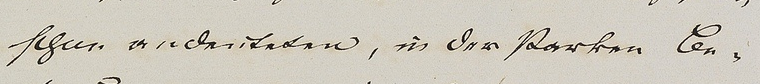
schon andeuteten, in der starken Be-
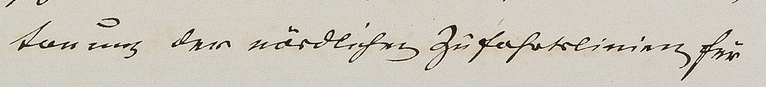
tonung der nördlichen Zufahrtslinien für
